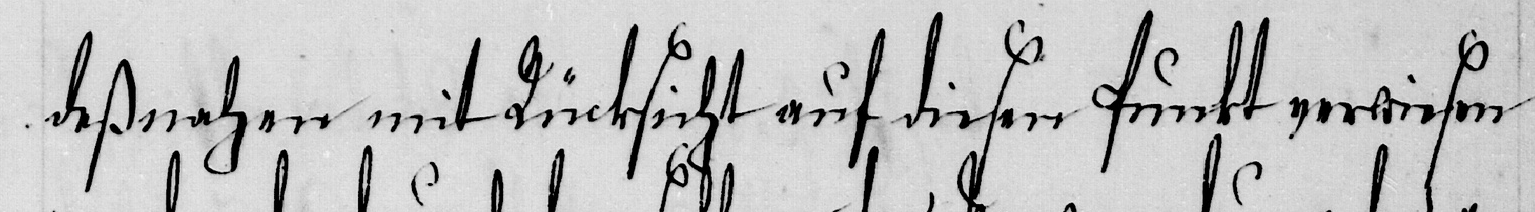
deßnahen mit Rücksicht auf diesen Punkt verwiesen
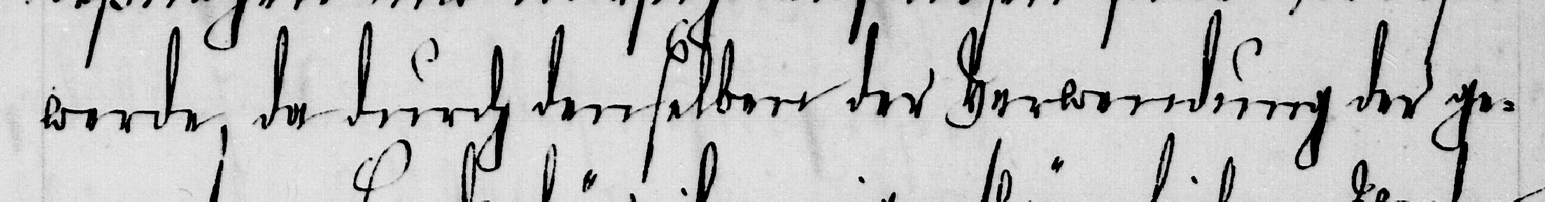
werde, da durch denselben der Verwendung der ge¬
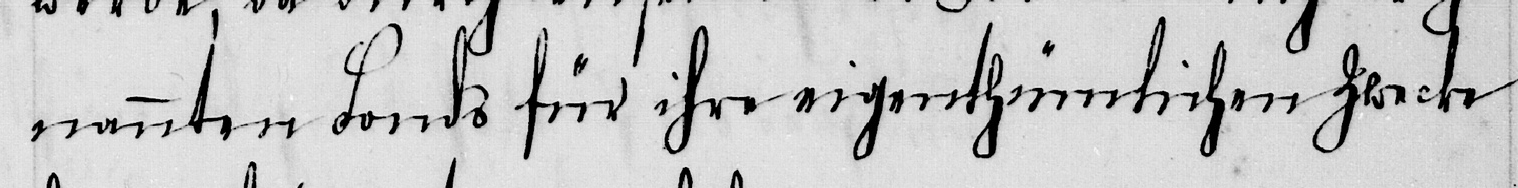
nannten Fonds für ihre eigenthümlichen Zwecke
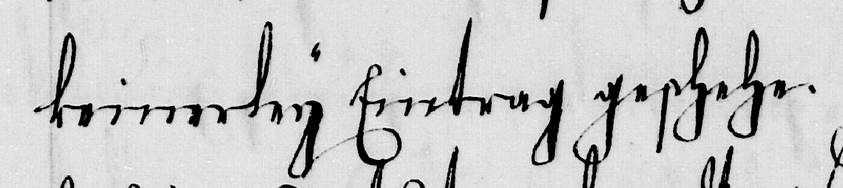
keinerley Eintrag geschehe.
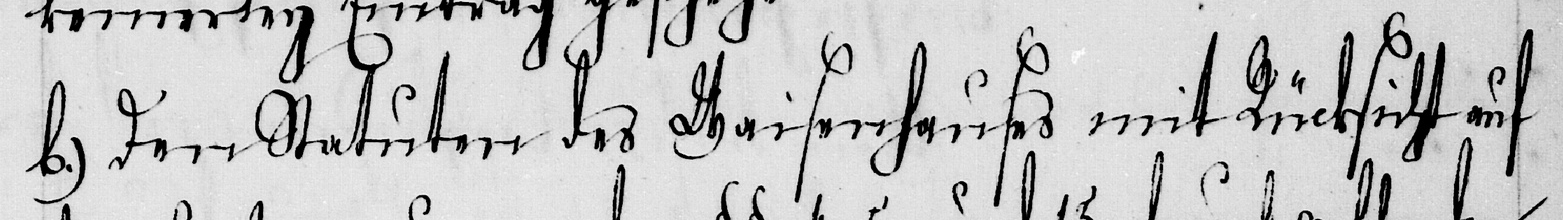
b.) Den Statuten des Waisenhauses mit Rücksicht auf
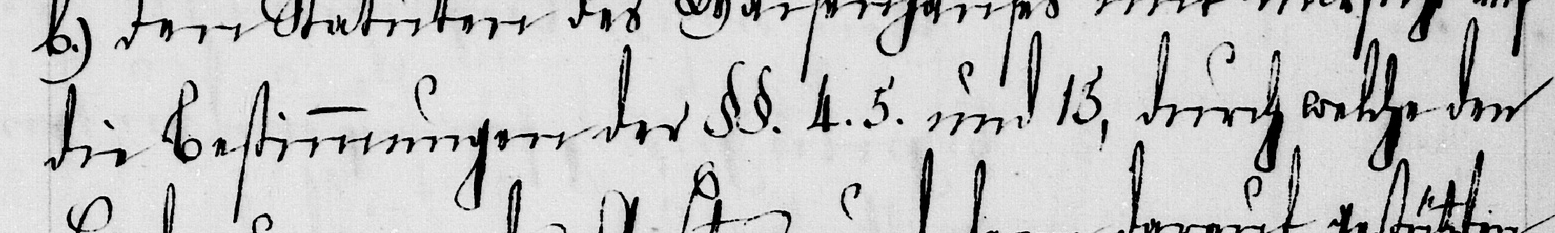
die Bestimmungen der §§. 4. 5. und 15, durch welche den
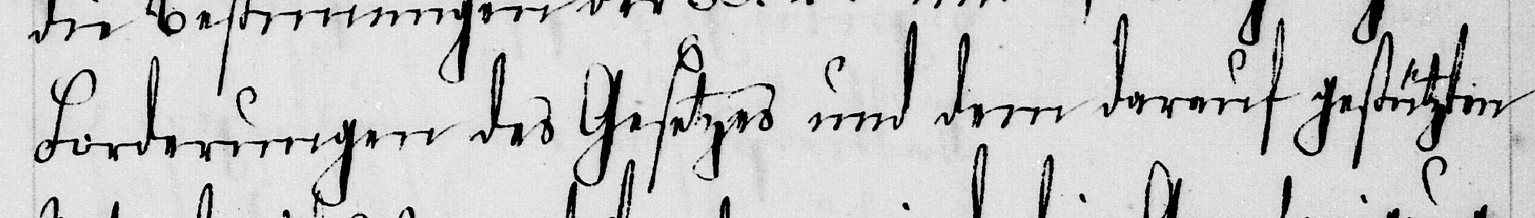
Forderungen des Gesetzes und dem darauf gestützten
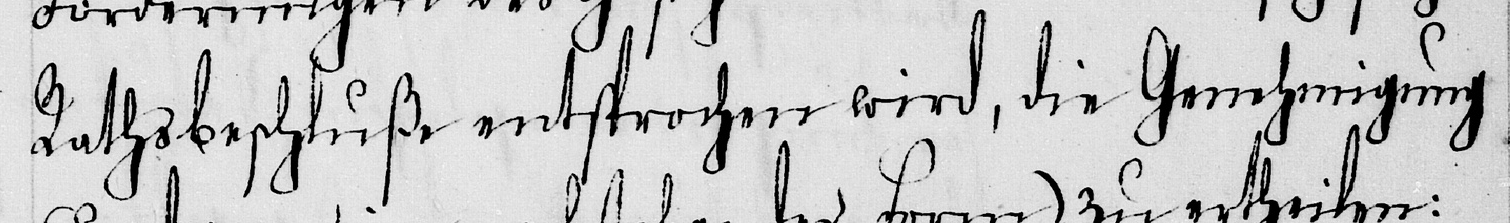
Rathsbeschluße entsprochen wird, die Genehmigung
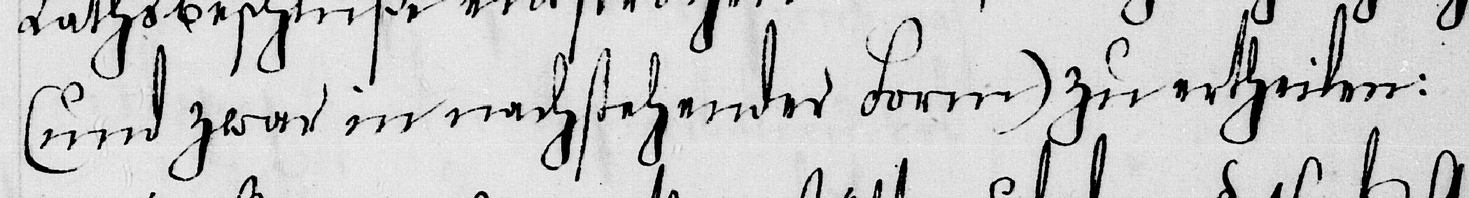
(und zwar in nachstehender Form) zu ertheilen:
